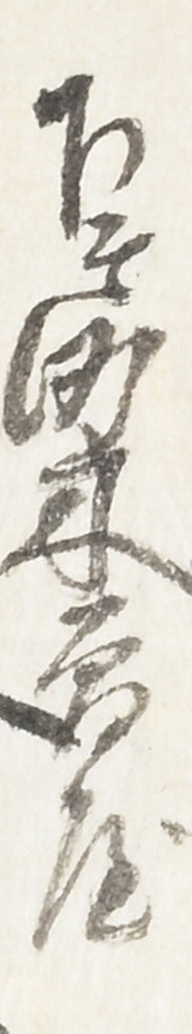下モ町木曽屋
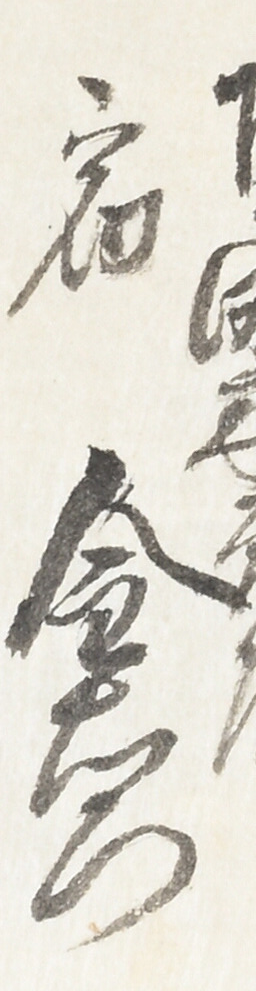宿金右衛門

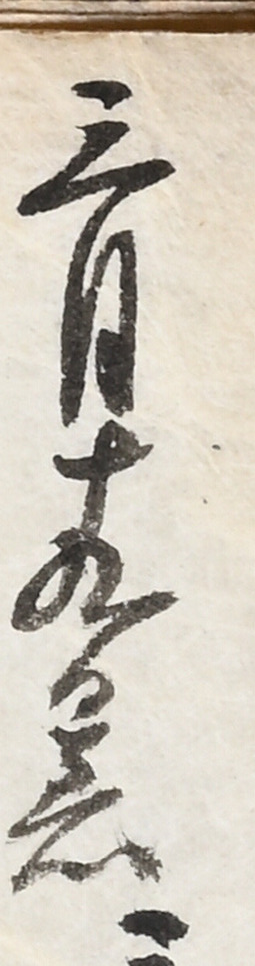三月十九日着
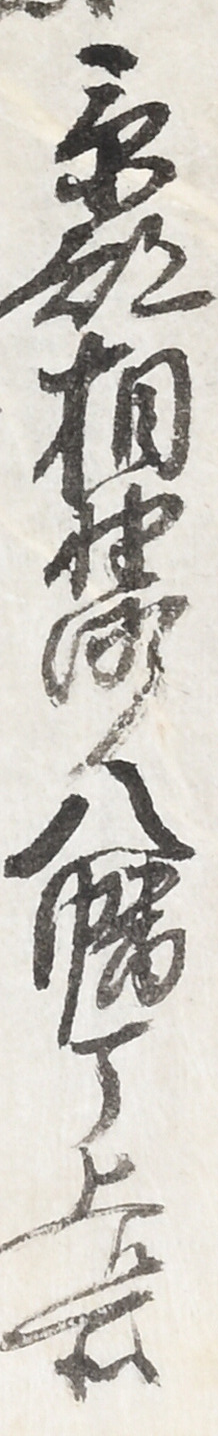京都相野町八幡丁上ル所
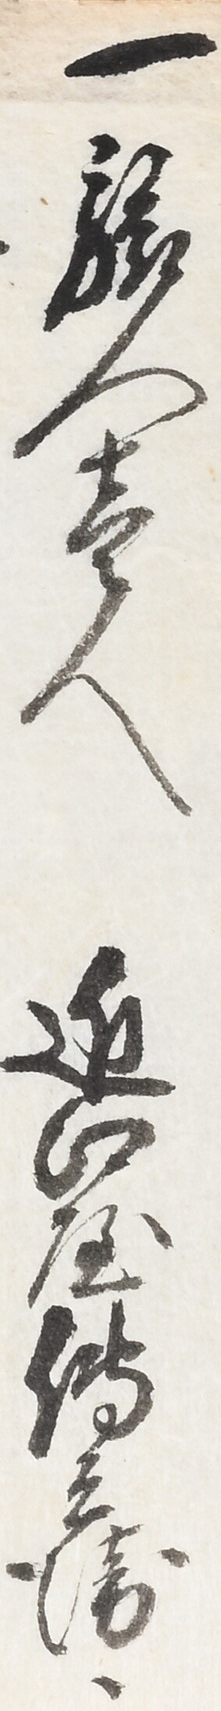一旅人壱人近江屋伝兵衛・
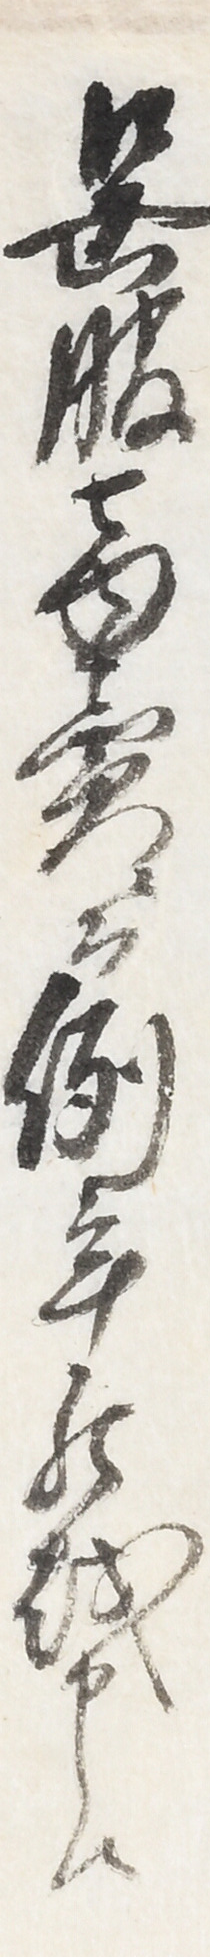呉服商売ニ而例年罷越申候
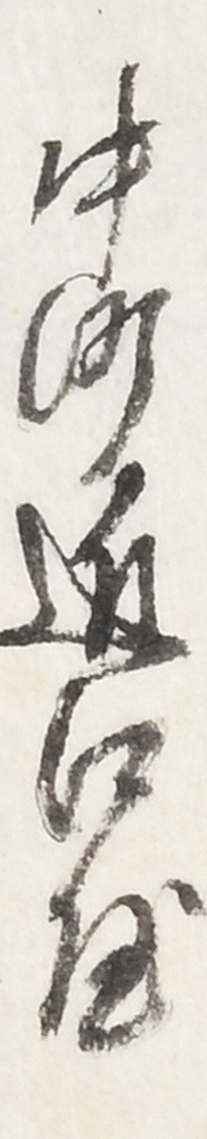中町近江屋
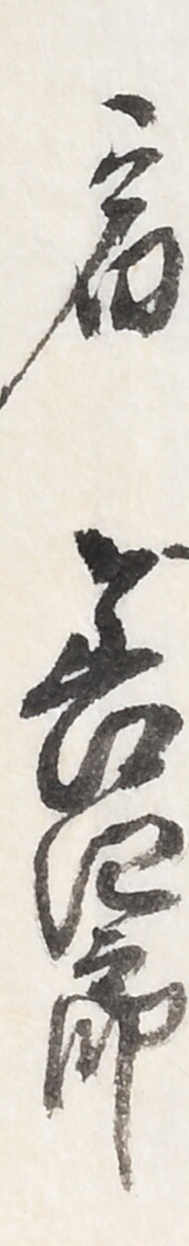宿善四郎
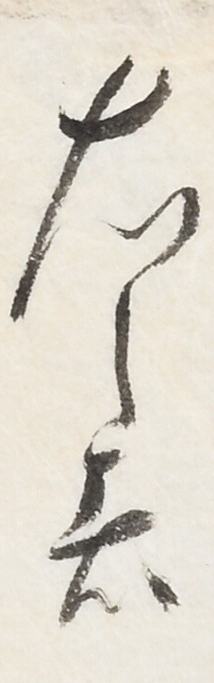右之者
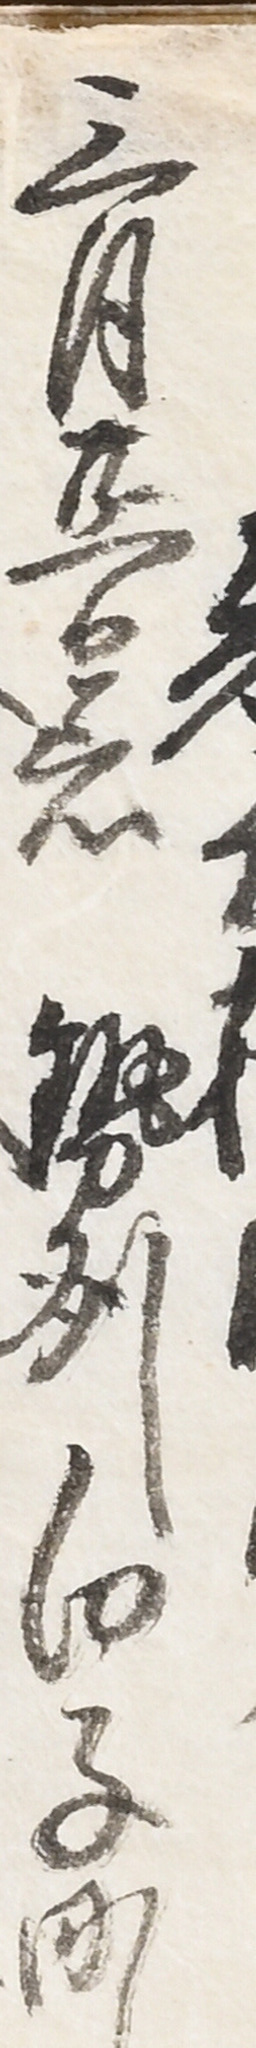三月廿一日着勢州白子町
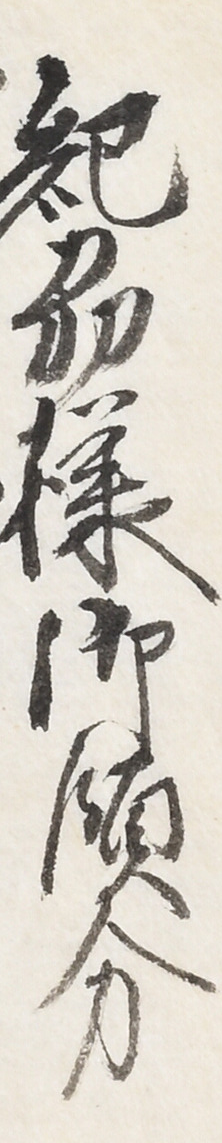紀州様御領分
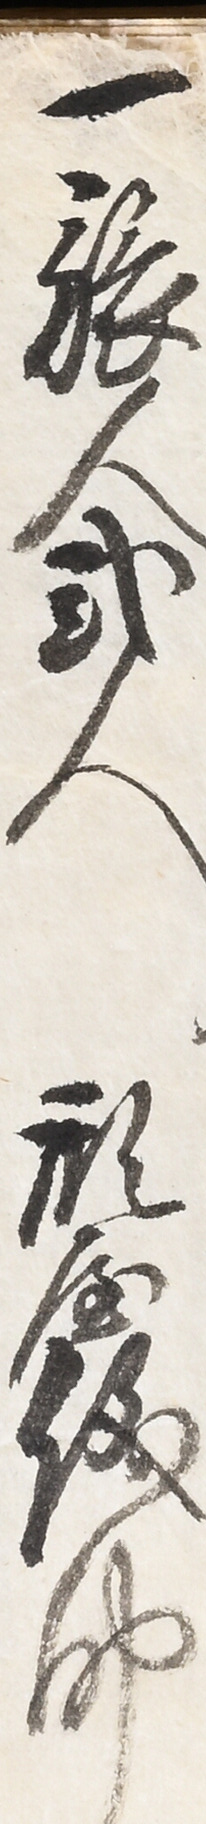一旅人弐人形屋儀助
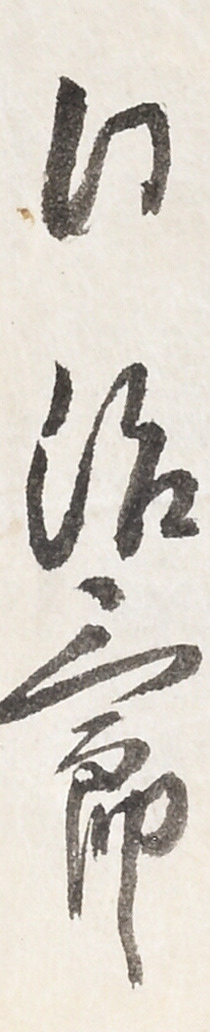同治三郎
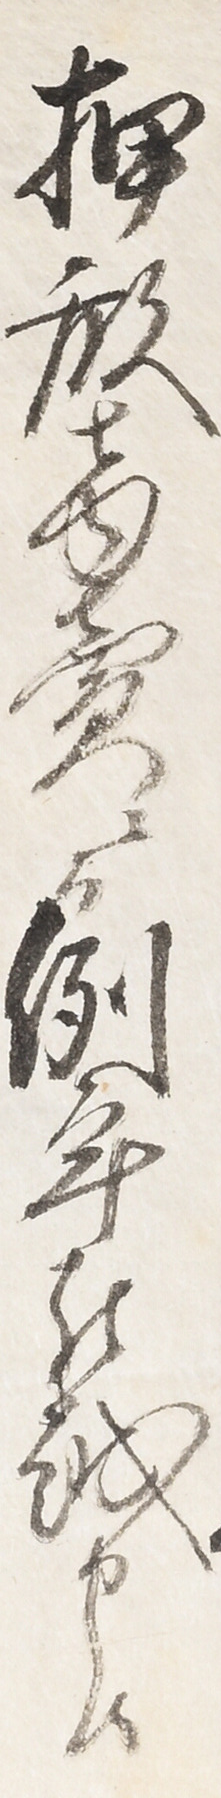押形商売ニ而例年罷越申候
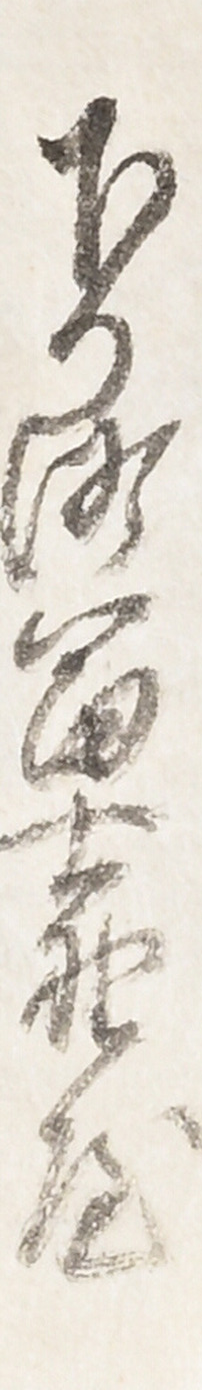下り町冨士野屋
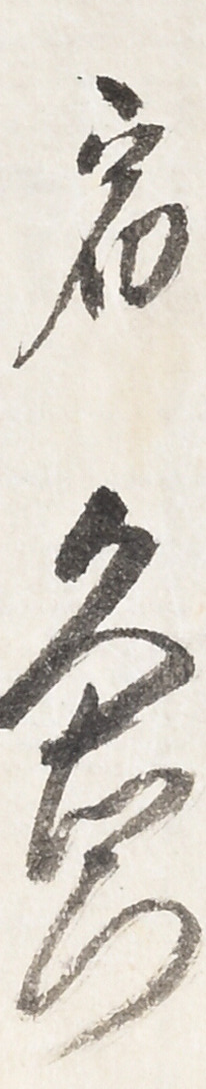宿久右衛門
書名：旅人泊控帳
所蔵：伊那市立高遠町図書館・合同会社AMANE
